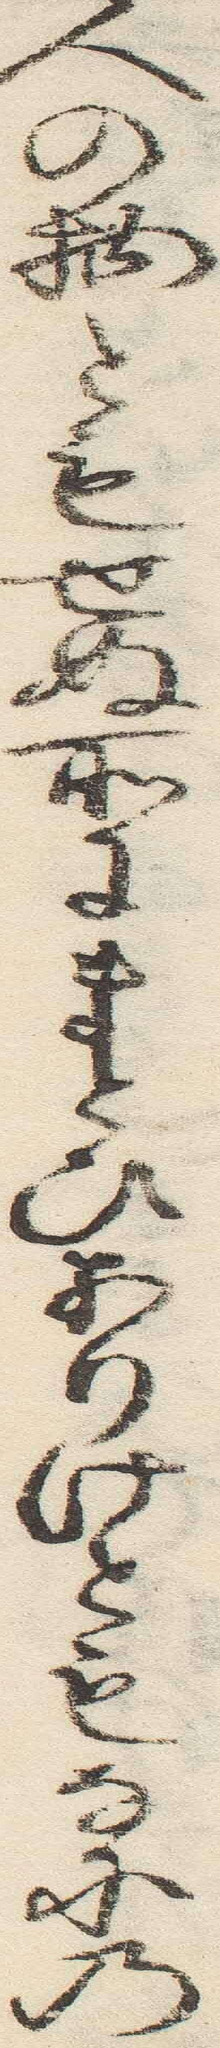人の物ともせぬ所にまとひありけともなにの
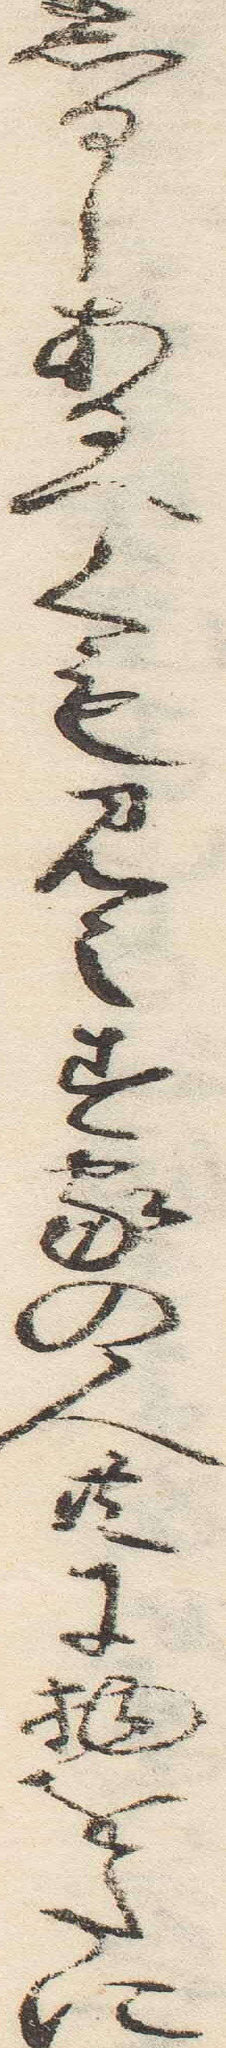しるしあるへくも見えす家の人共に物をたに
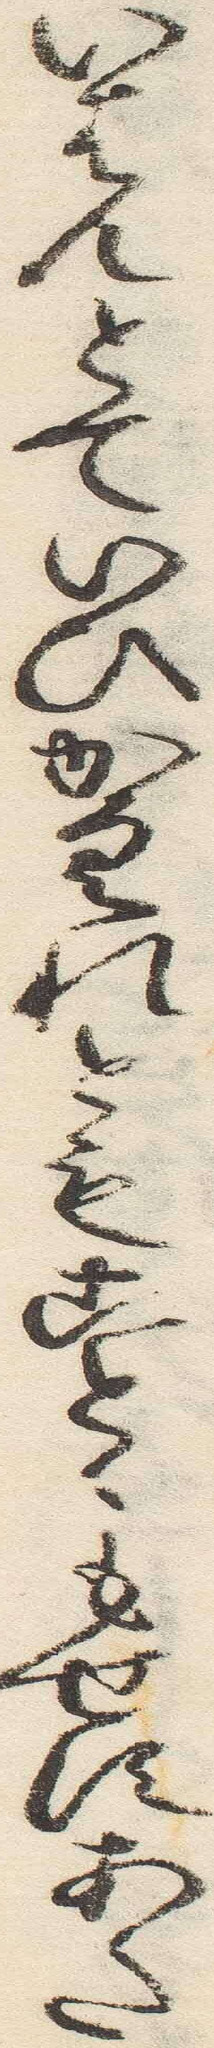いはんとていひかくれともことゝもせすあた
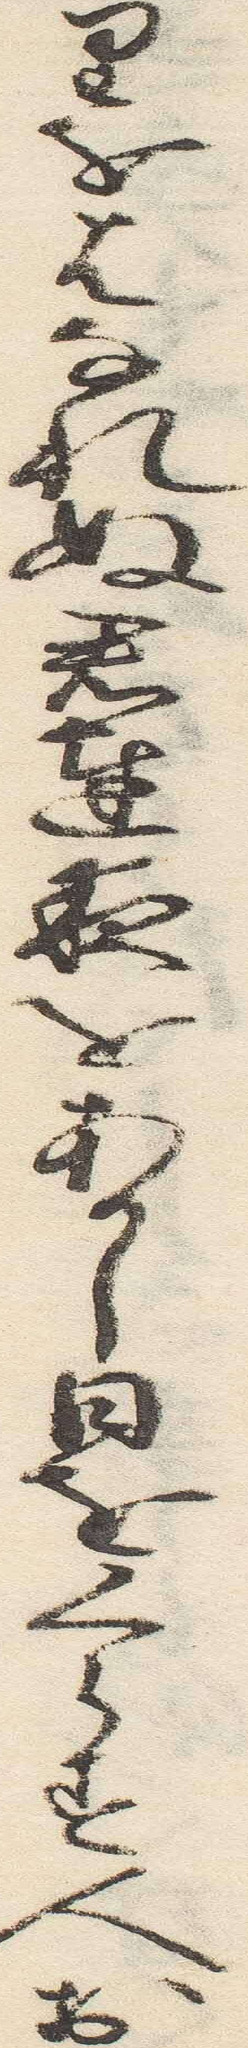りをはなれぬ君達夜をあかし日をくらす人お
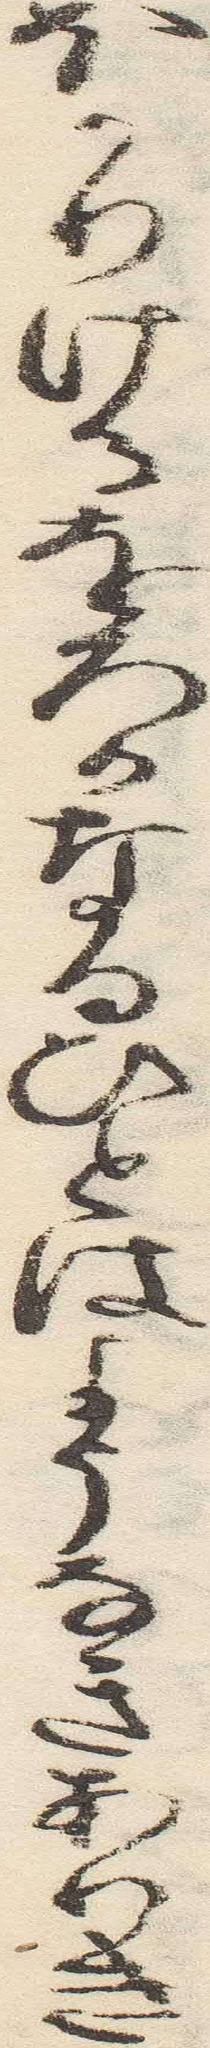ほかりけるをろかなるひとはようなきありき
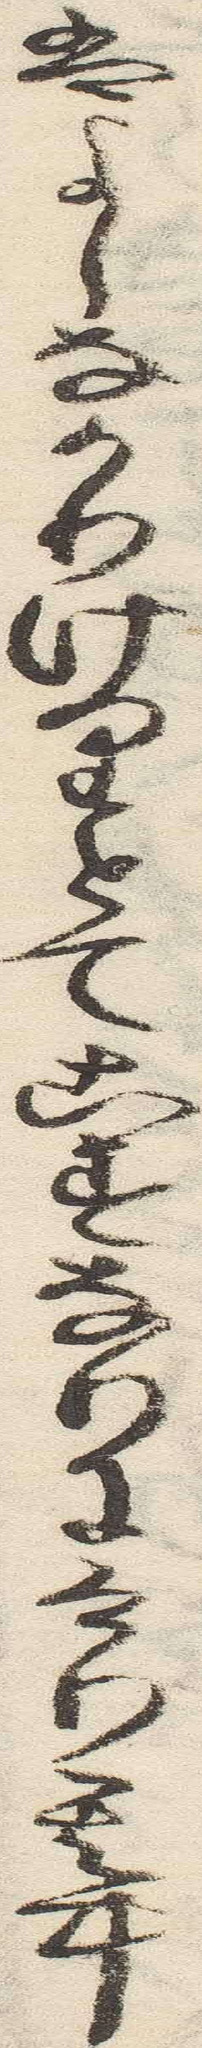はよしなかりけりとてこすなりにけり其中

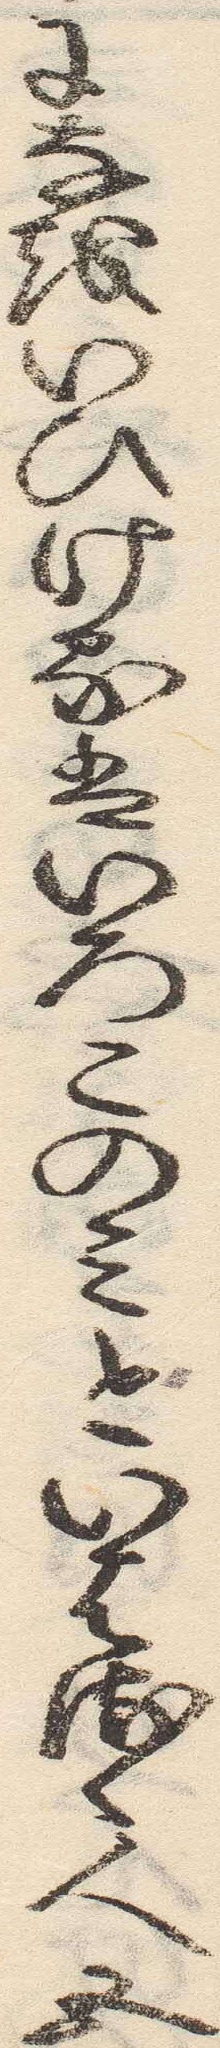になをいひけるはいろこのみといはるゝ人五
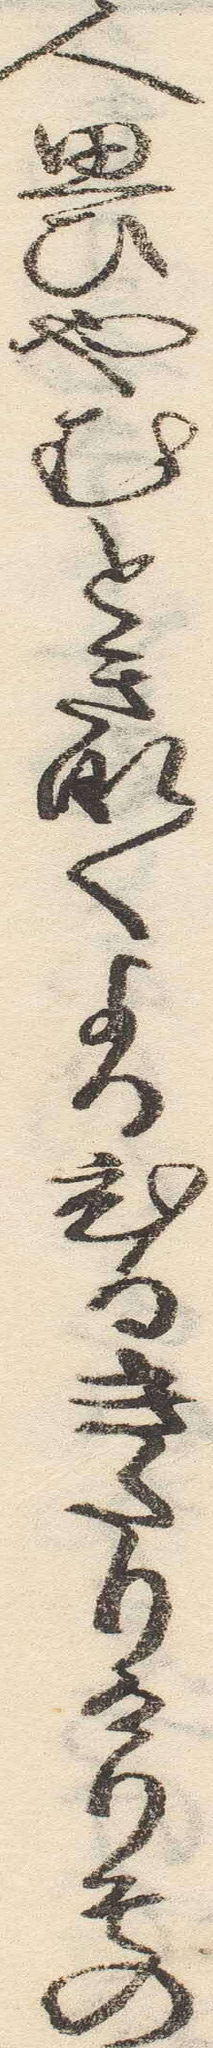人思ひやむときなくよるひるきたりけりその
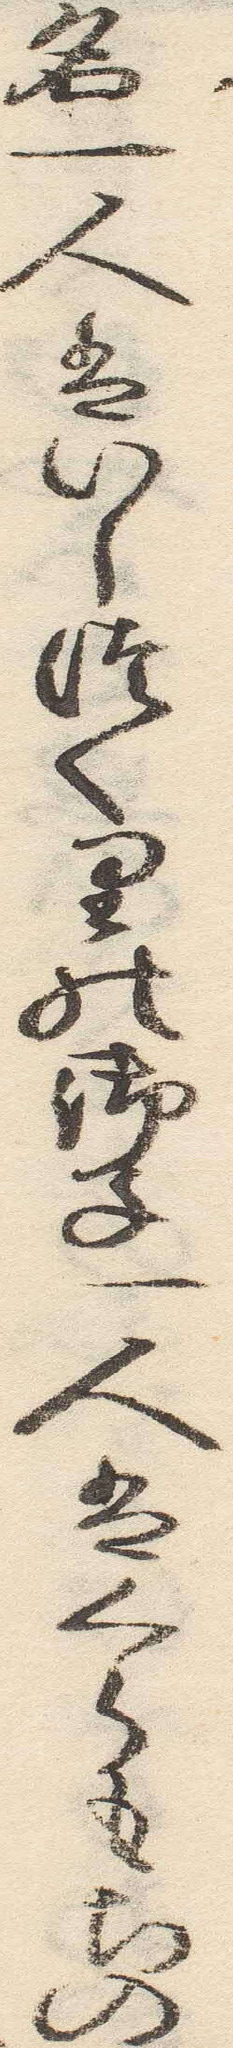名一人はいしつくりの御子一人はくらもちの
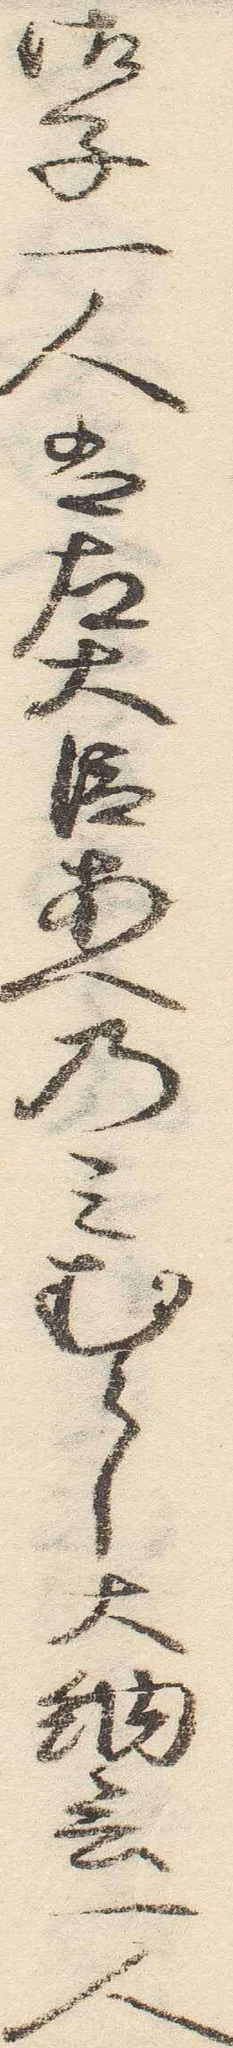御子一人は右大臣あへのみむらし大納言一人
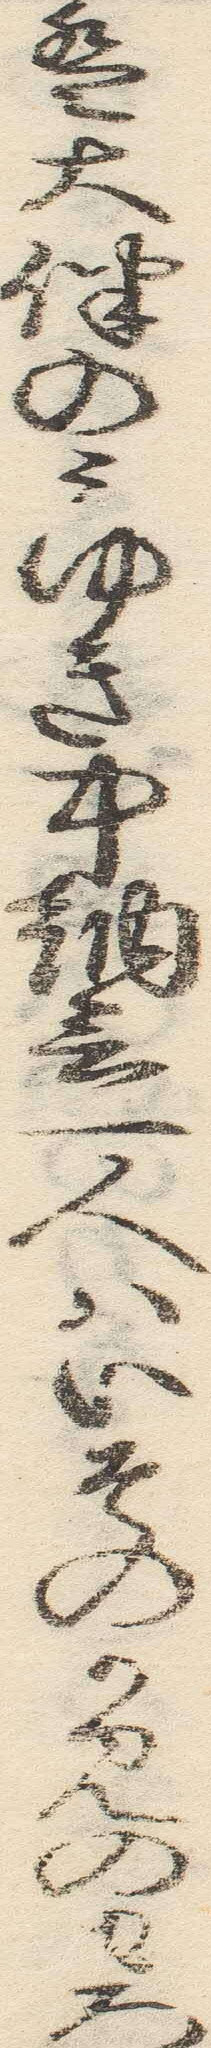は大伴のみゆき中納言一人はいそのかみのもろ
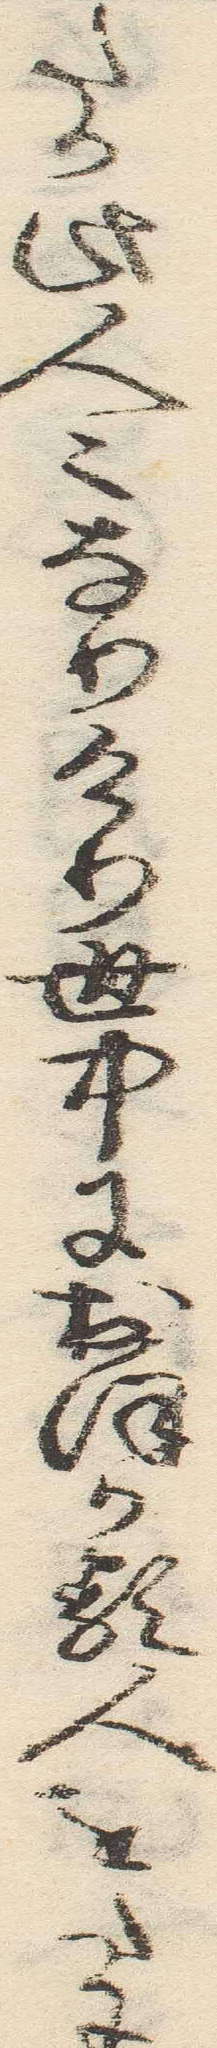たか此人々なりけり世中におほかる人をたに
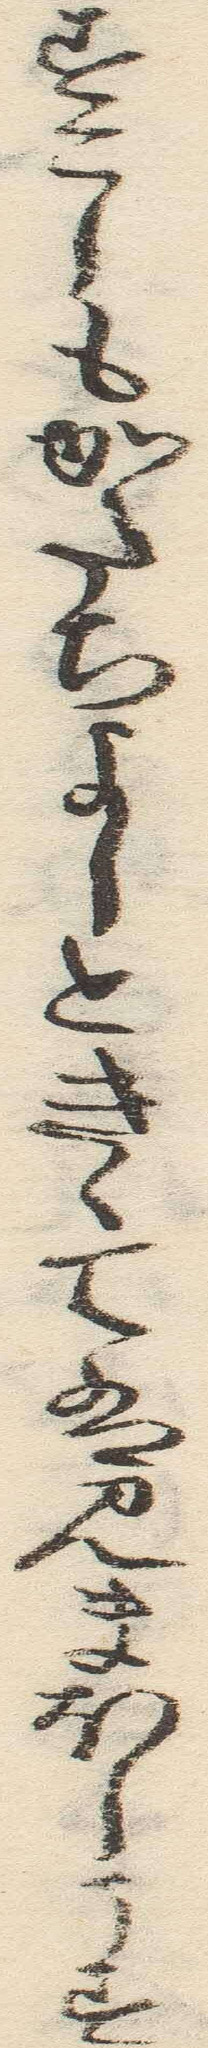すこしもかたちよしときゝては見まほしうす
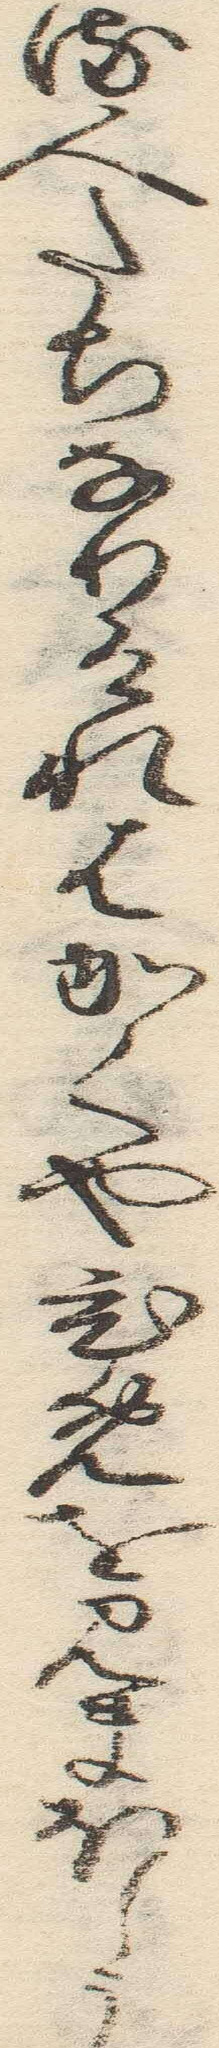る人たちなりけれはかくやひめを見まほしう
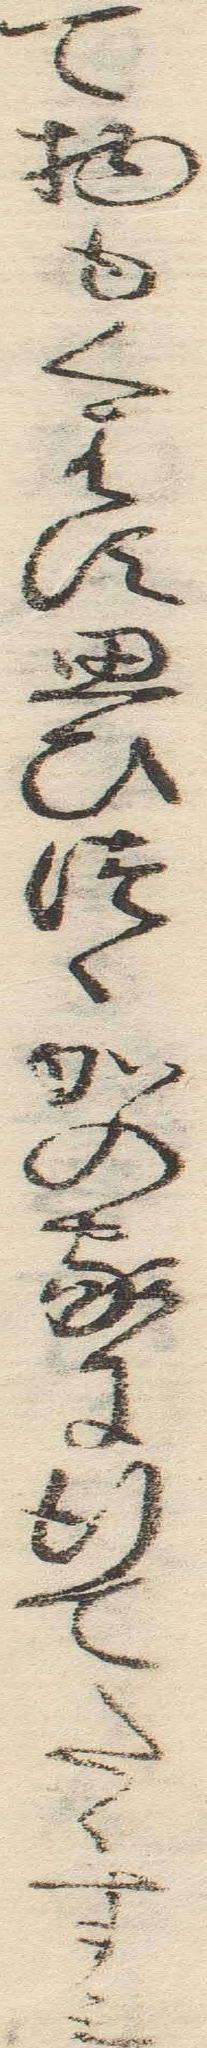て物もくはす思ひつゝかの家に行てたゝすみ
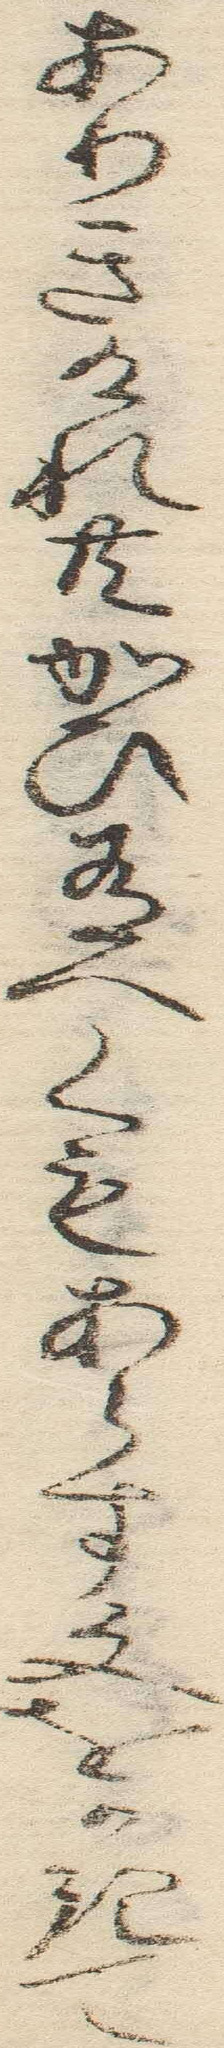ありきけれ共かひ有へくもあらす文をかきて
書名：竹取物語
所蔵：東京学芸大学附属図書館 国文学研究資料館
